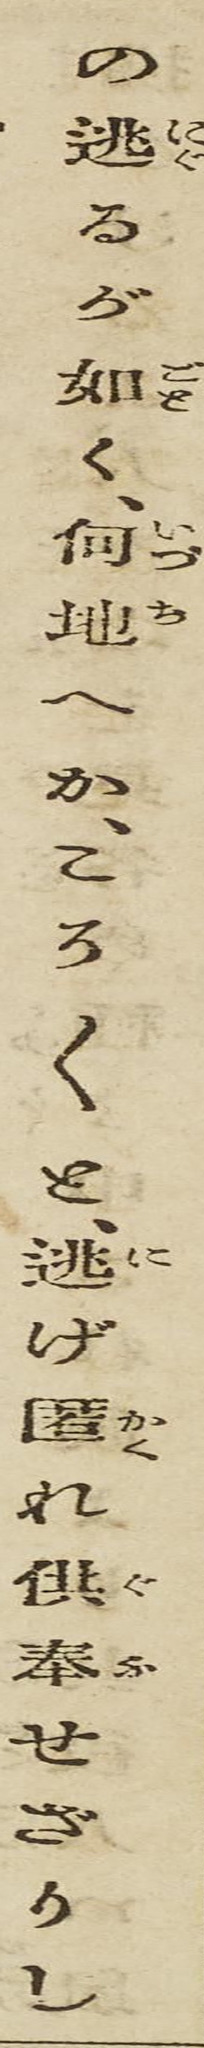の逃るが如く、何地へか、ころ〳〵と、逃げ匿れ供奉せざりし
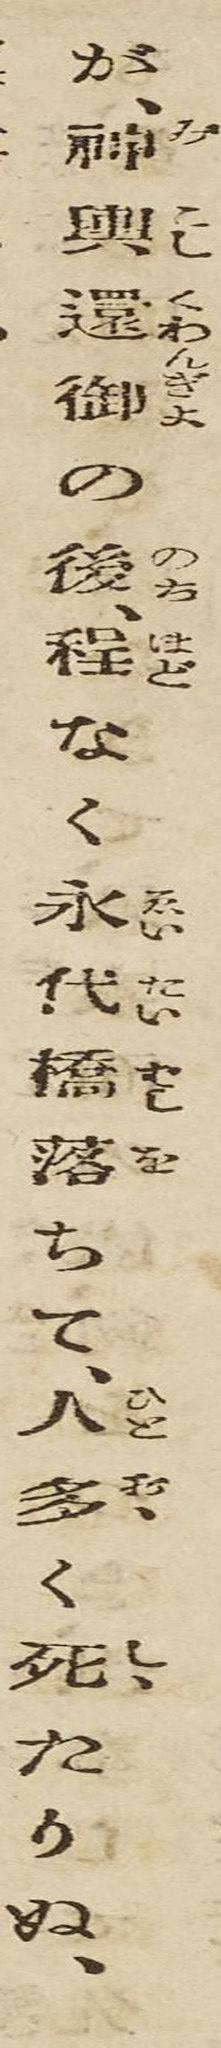が、神輿還御の後、程なく永代橋落ちて、人多く死たりぬ、
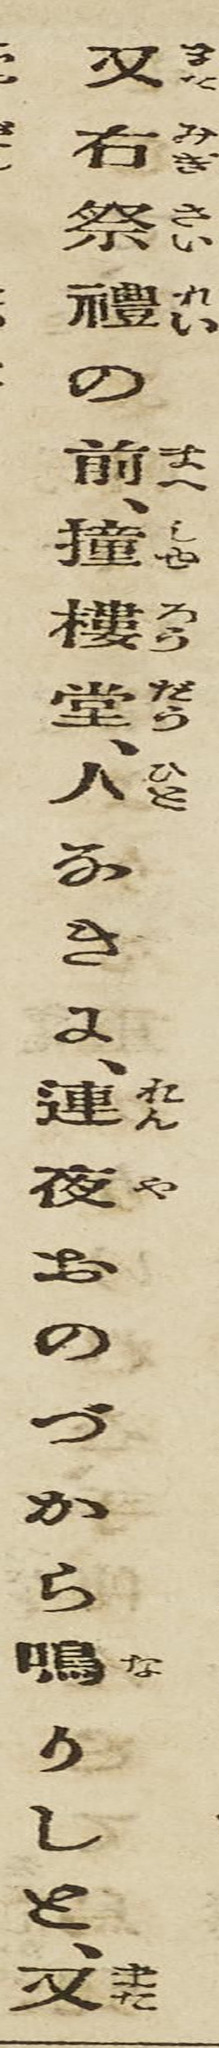又右祭礼の前、撞楼堂、人なきに、連夜おのづから鳴りしと、又
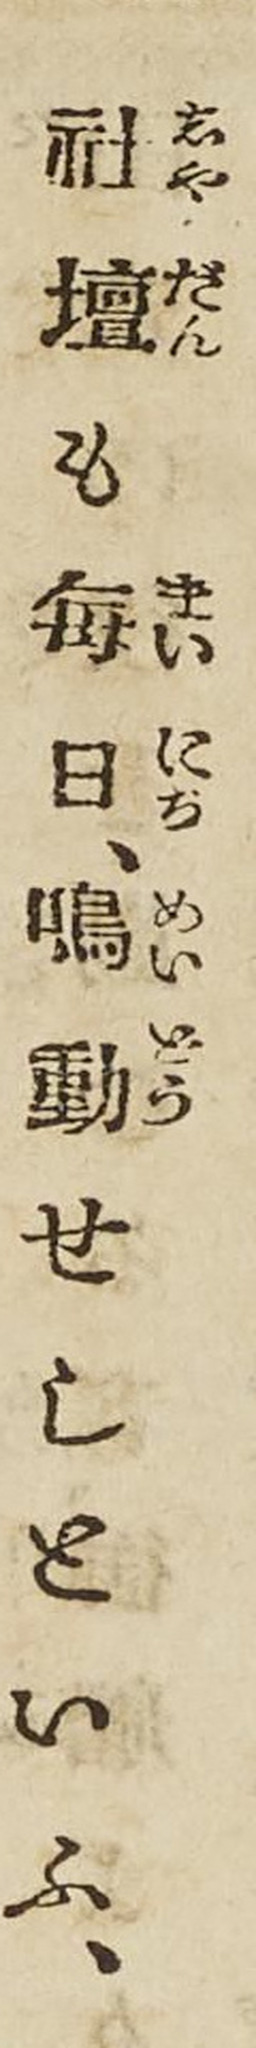社壇も毎日、鳴動せしといふ、
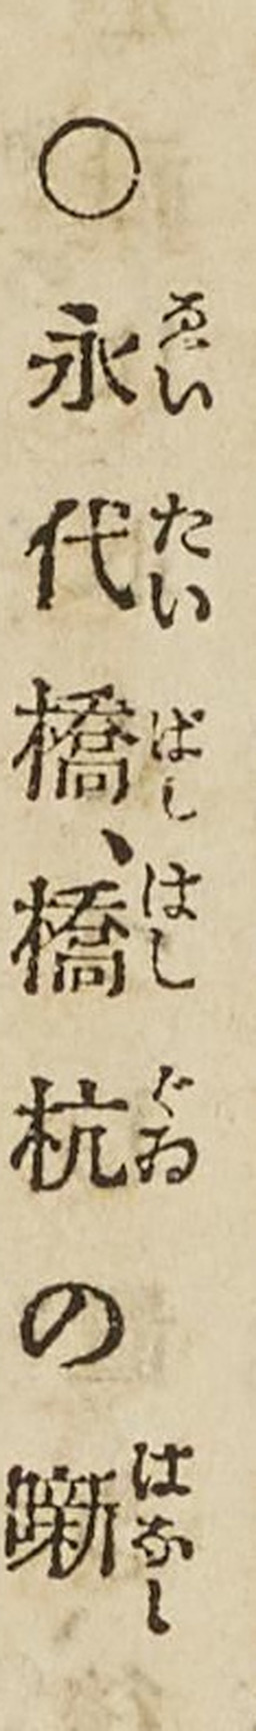○永代橋、橋杭の噺
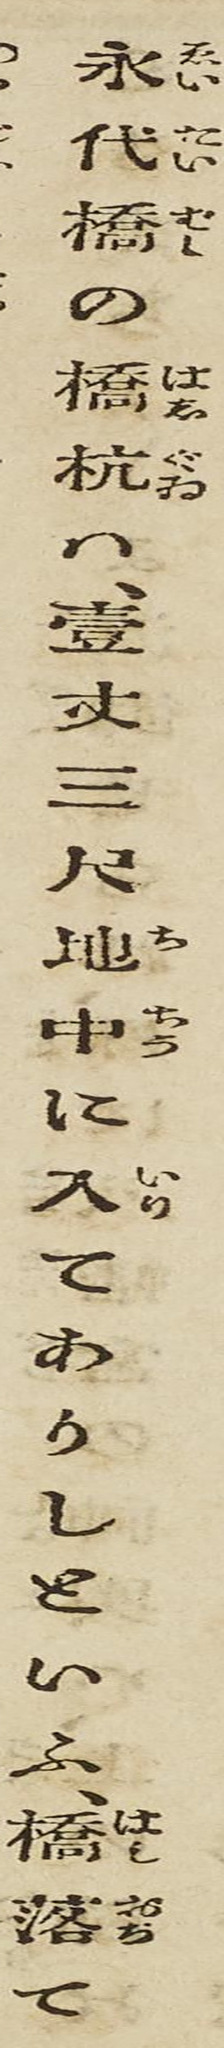永代橋の橋杭は、壹丈三尺地中に入てありしといふ、橋落て
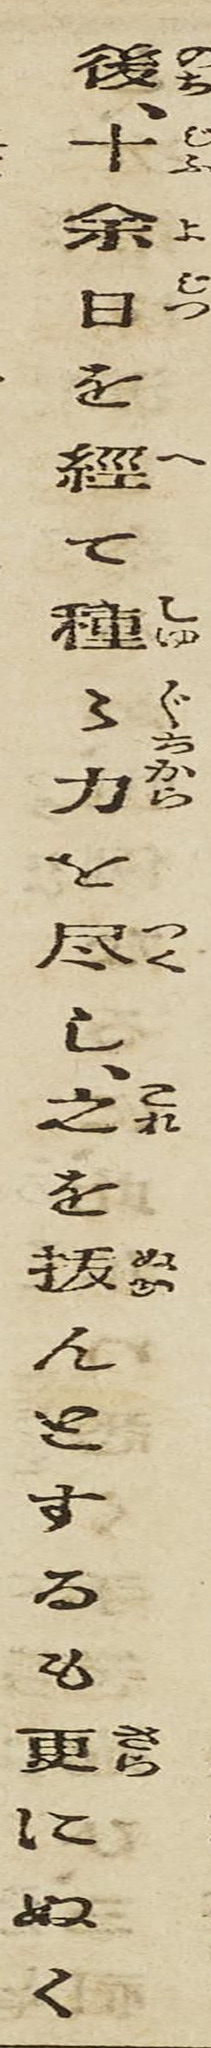後、十余日を経て種々力を尽し、之を拔んとするも更にぬく
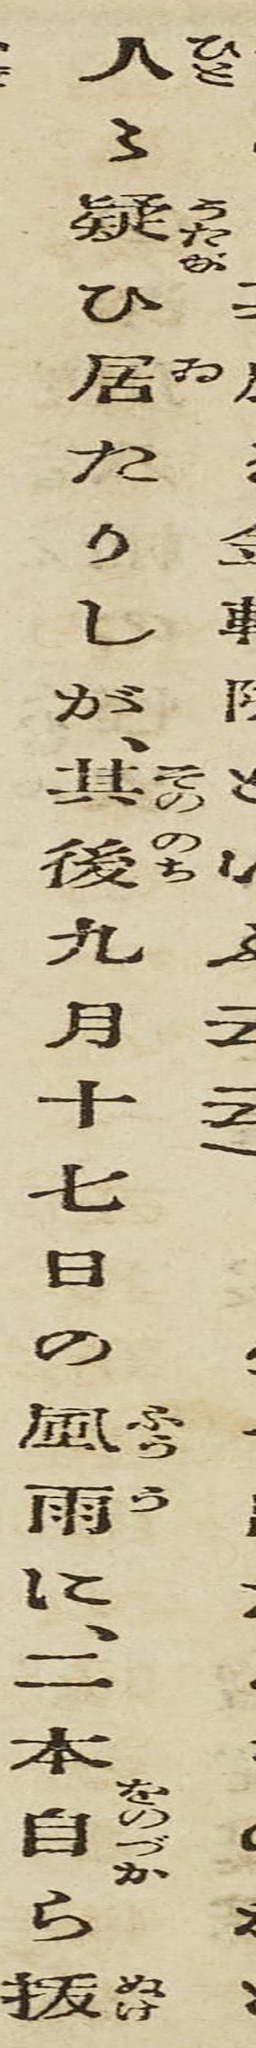人〻疑ひ居たりしが、其後九月十七日の風雨に、二本自ら拔
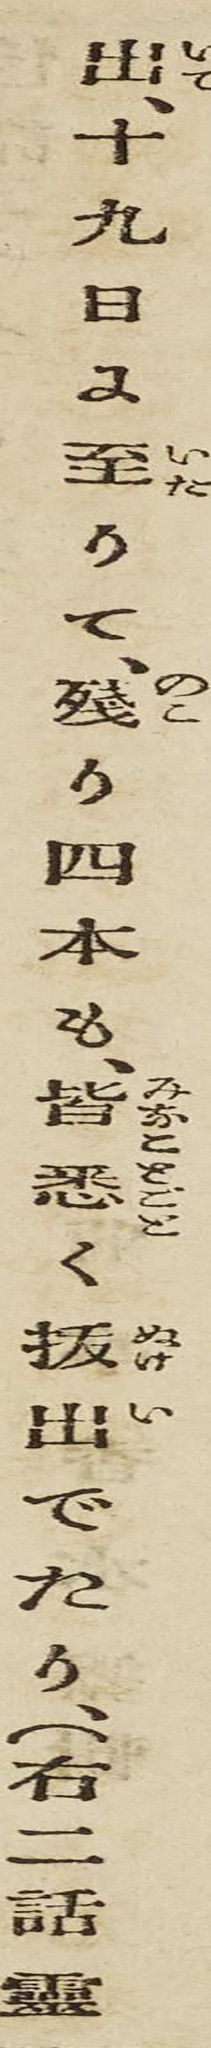出、十九日に至りて、残り四本も、皆悉く拔出でたり、（右二話霊
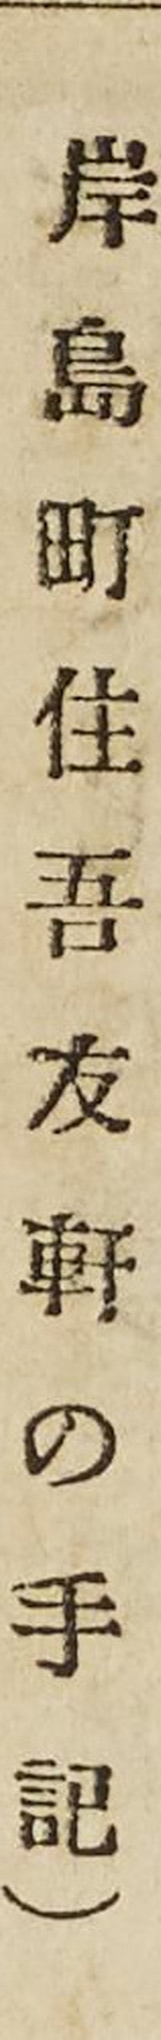岸島町住吾友軒の手記）
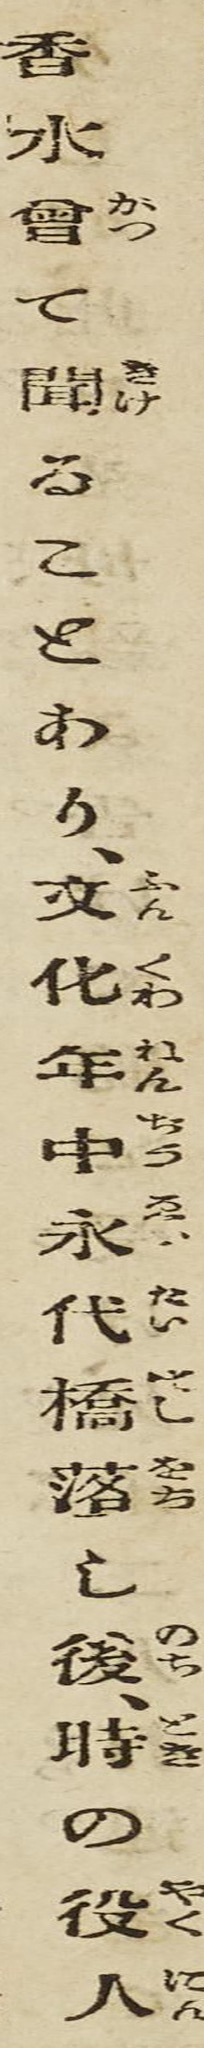香水曽て聞ることあり、文化年中永代橋落し後、時の役人
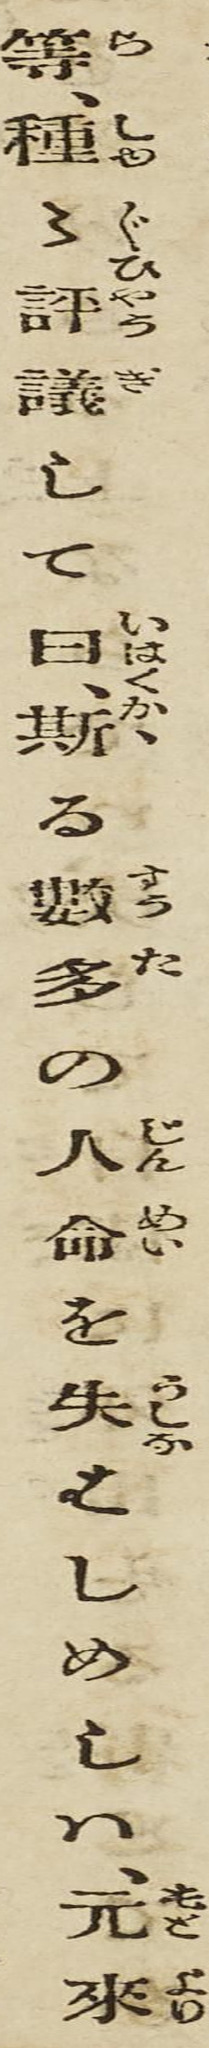等、種〻評議して曰、斯る数多の人命を失はしめしは、由元来
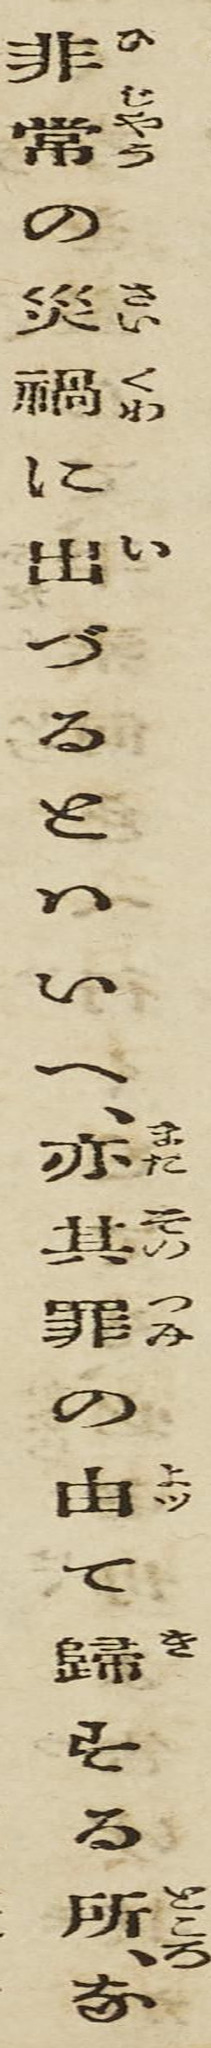非常の災禍に出づるとはいへ、亦其罪の由て帰する所、な
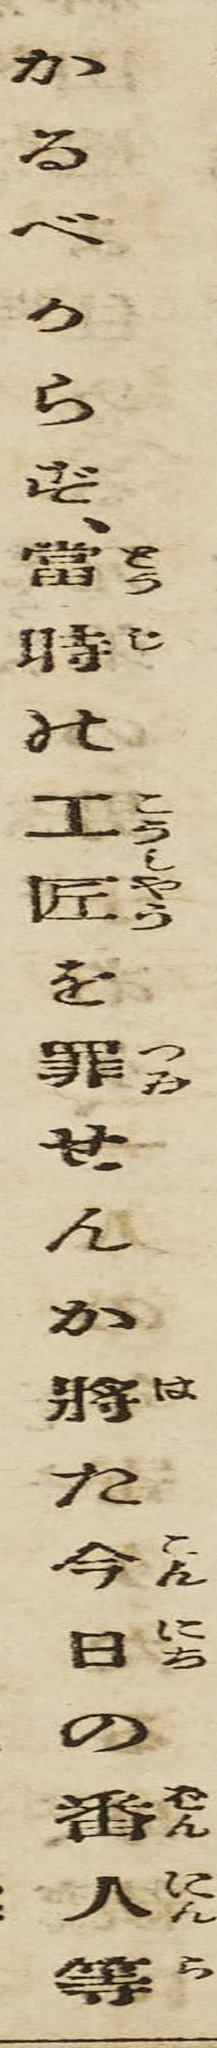かるべからず、当時の工匠を罪せんか将た今日の番人等
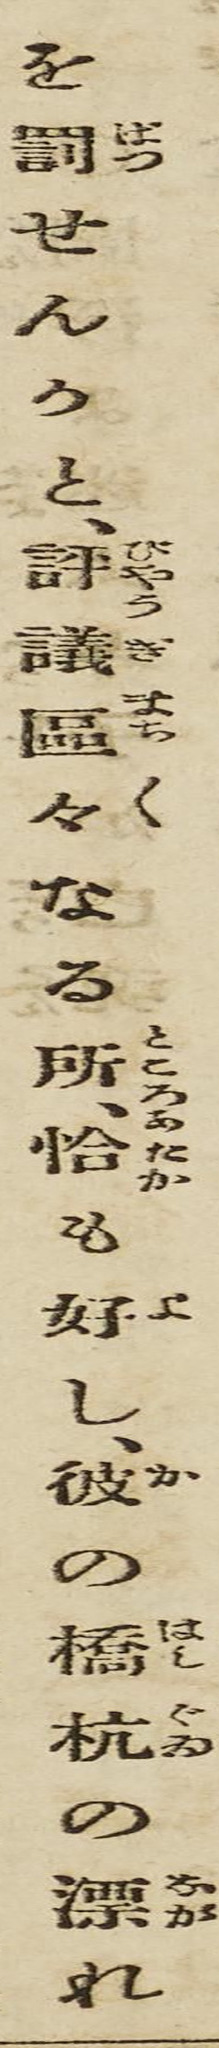を罰せんかと、評議区々なる所、恰も好し、彼の橋杭の漂れ
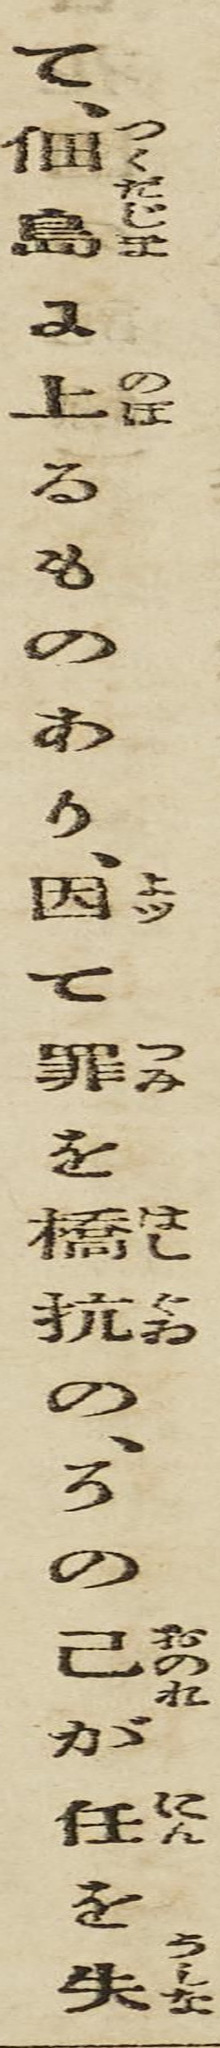て、佃島に上るものあり、因て罪を橋杭の、その己が任を失
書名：永代惨話　文化の夢　全
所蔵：東京大学地震研究所図書室 Earthquake Research Institute Library, The University of Tokyo, JAPAN
